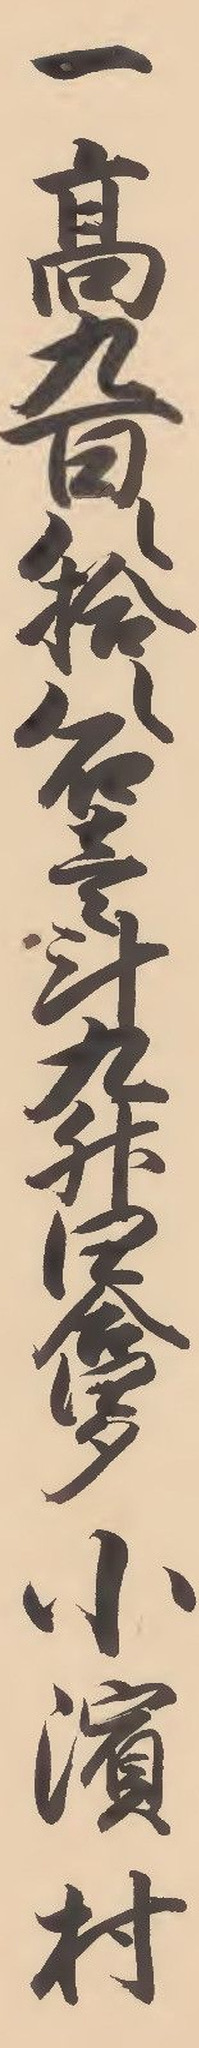一高九百拾八石壱斗九升四合四勺小濱村
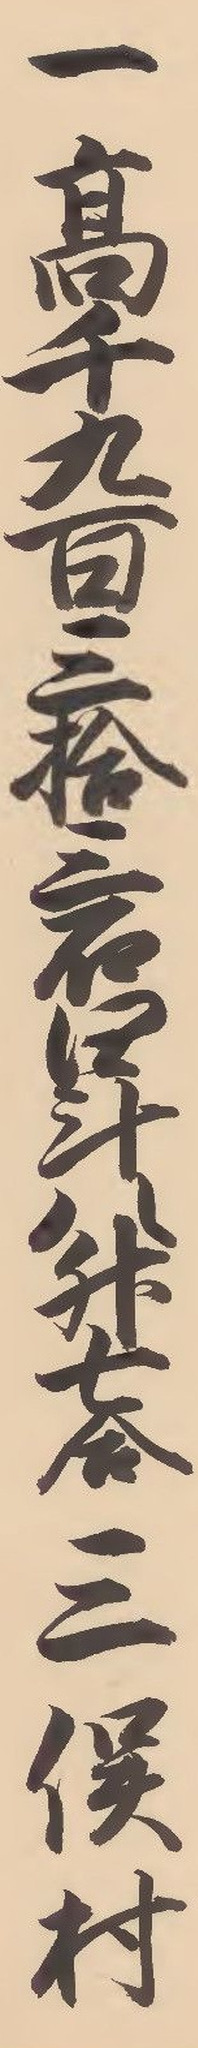一高千九百三拾三石四斗八升七合三俣村

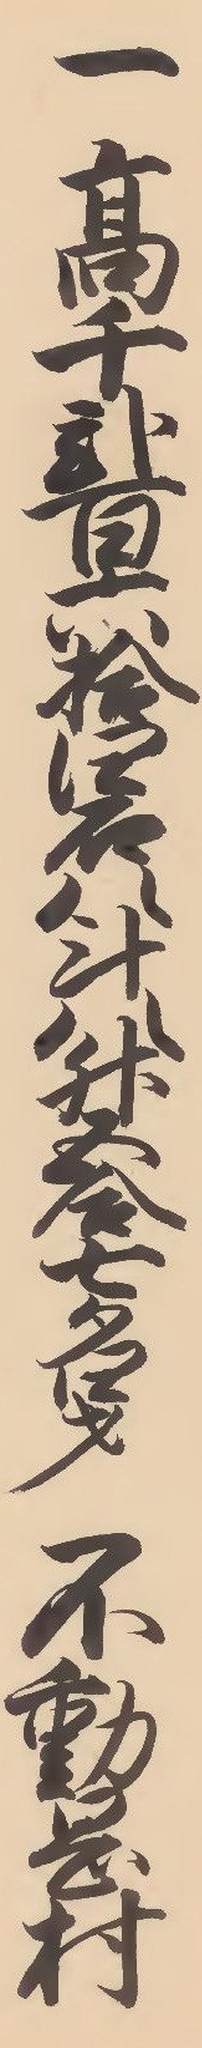一高千弐百六拾四石八斗八升五合七勺四才不動岡村
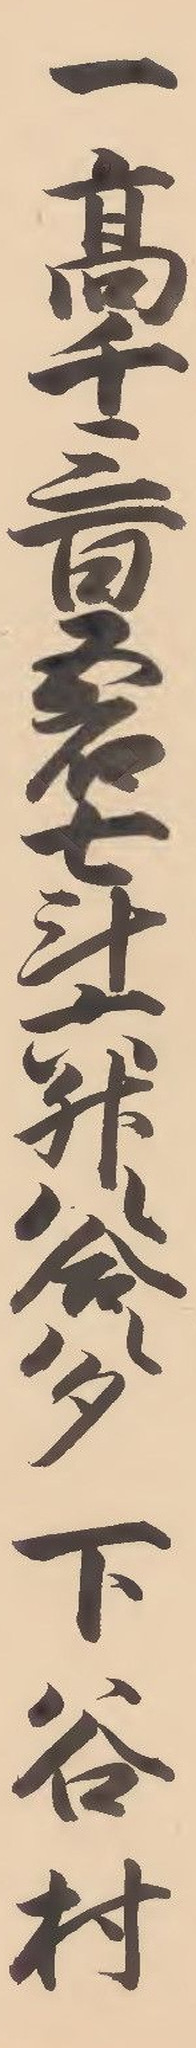一高千三百五石七斗六升八合八勺下谷村
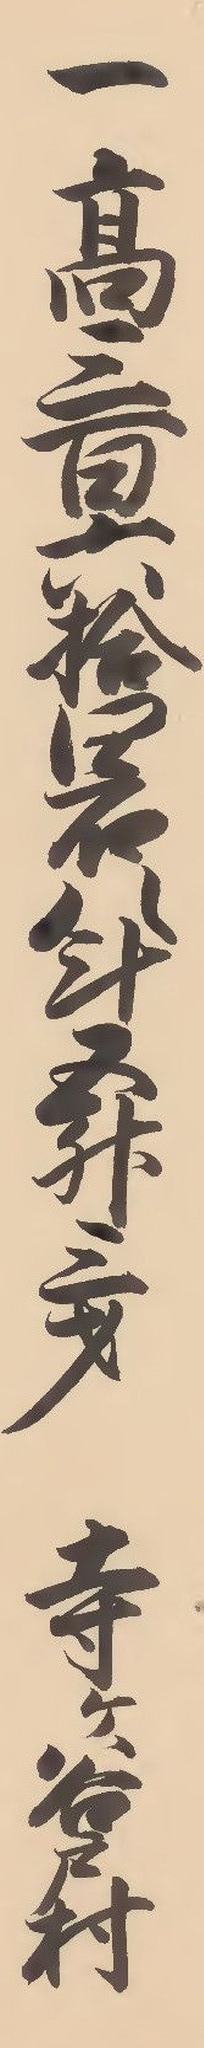一高三百六拾四石八斗五升三才寺ヶ谷戸村
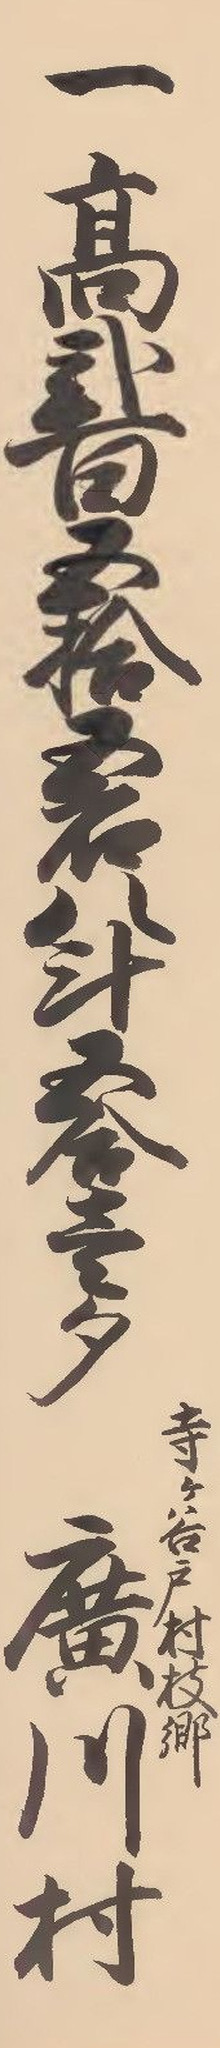一高弐百五拾五石八斗五合壱勺広川村
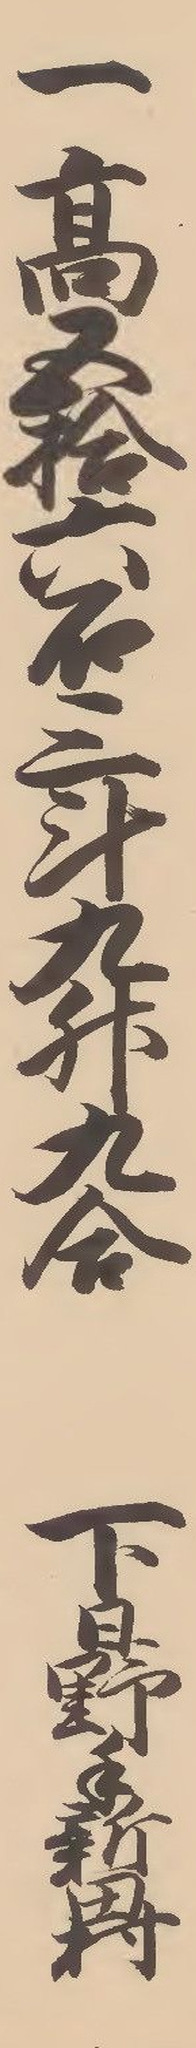一高五拾六石三斗九升九合下日野手新田村
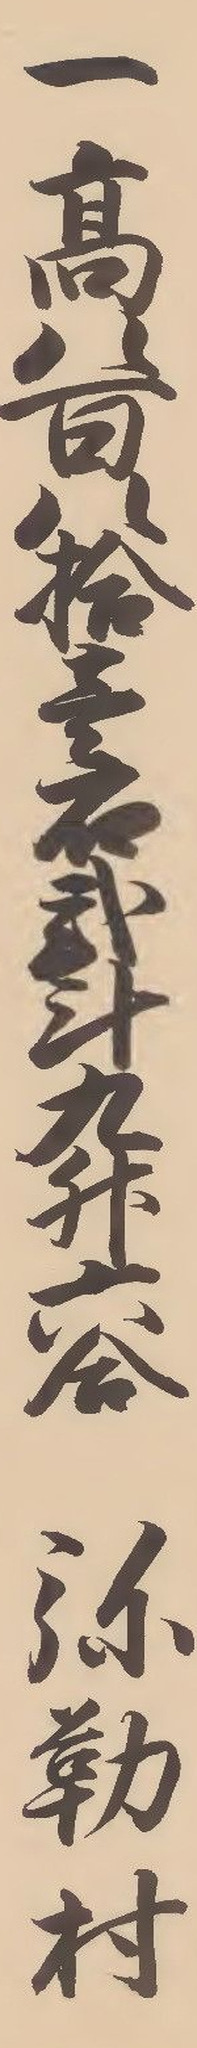一高八百八拾壱石弐斗九升六合弥勤村
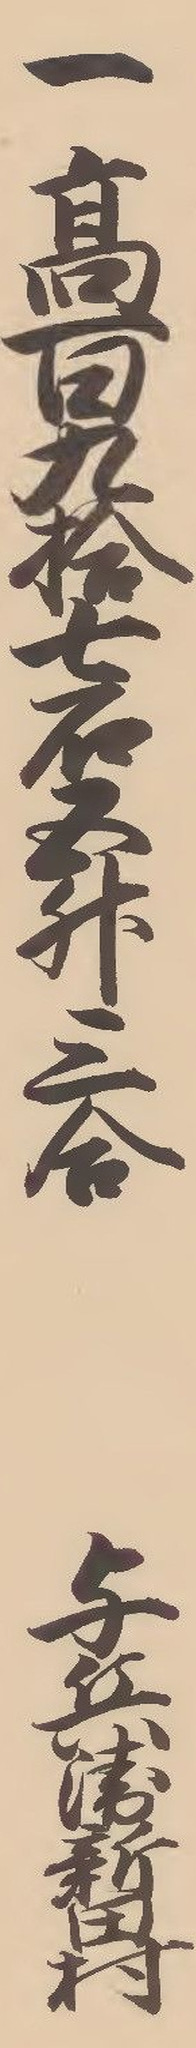一高百九拾七石五升三合与兵衛新田村

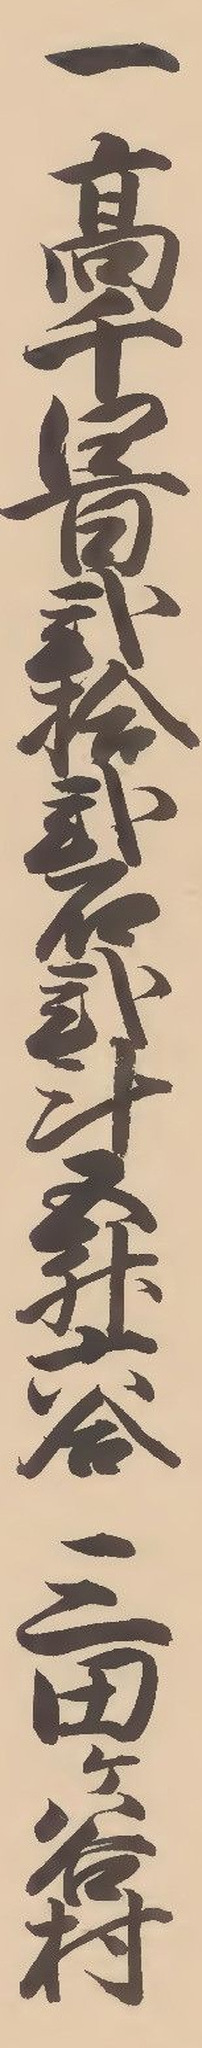一高千四百弐拾弐石弐斗五升六合三田ヶ谷村
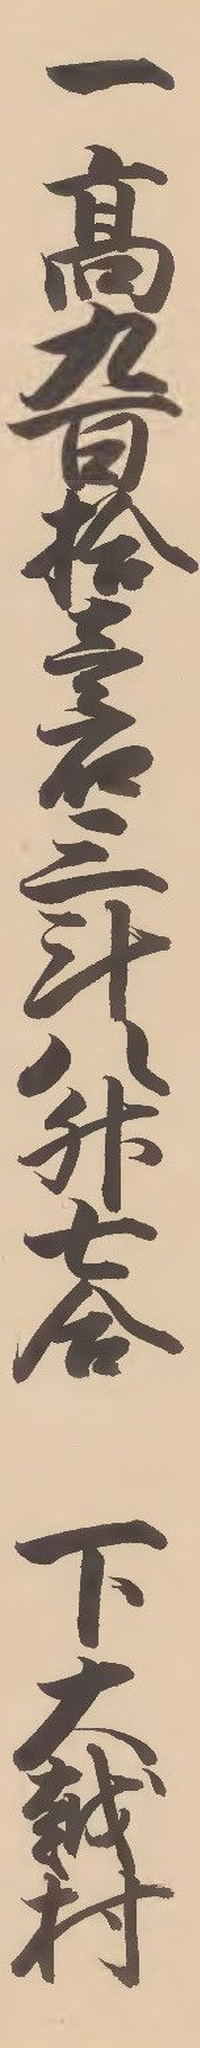一高九百拾壱石三斗八升七合下大越村
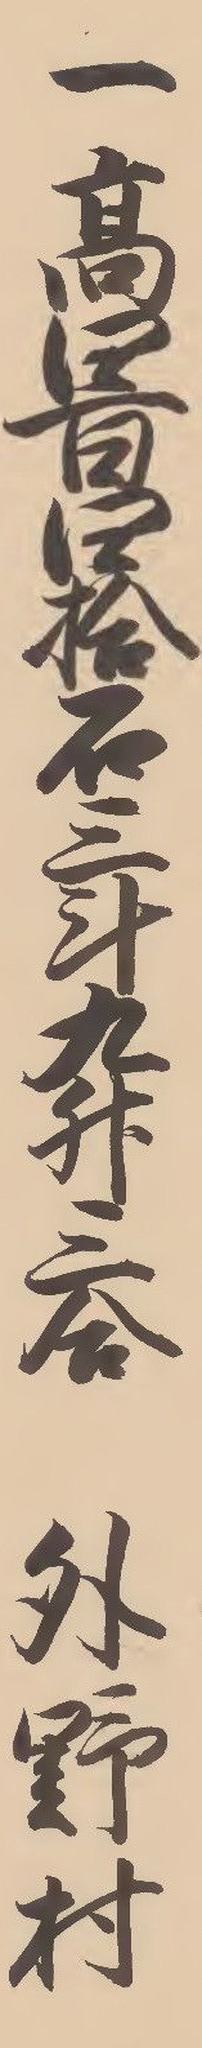一高四百四拾石三斗九升三合外野村
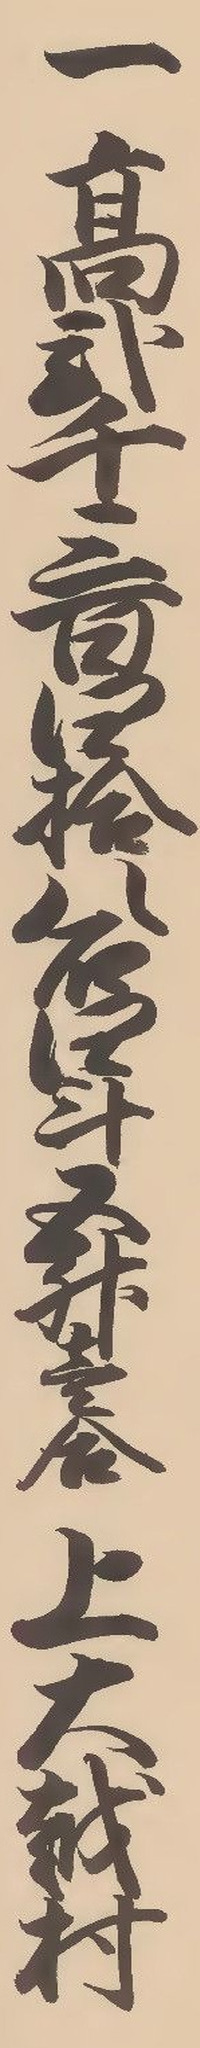一高弐千三百四拾八石四斗五升壱合上大越村
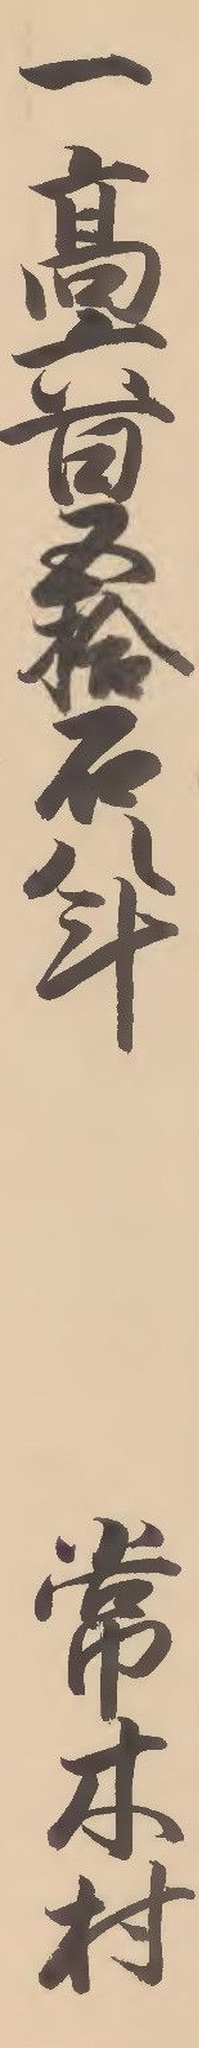一高六百五拾石八斗常木村
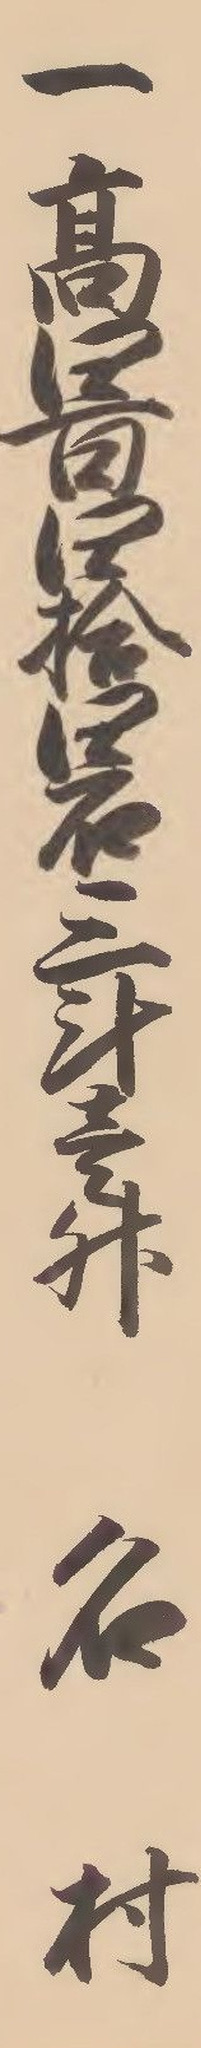一高四百四拾四石三斗壱升名村
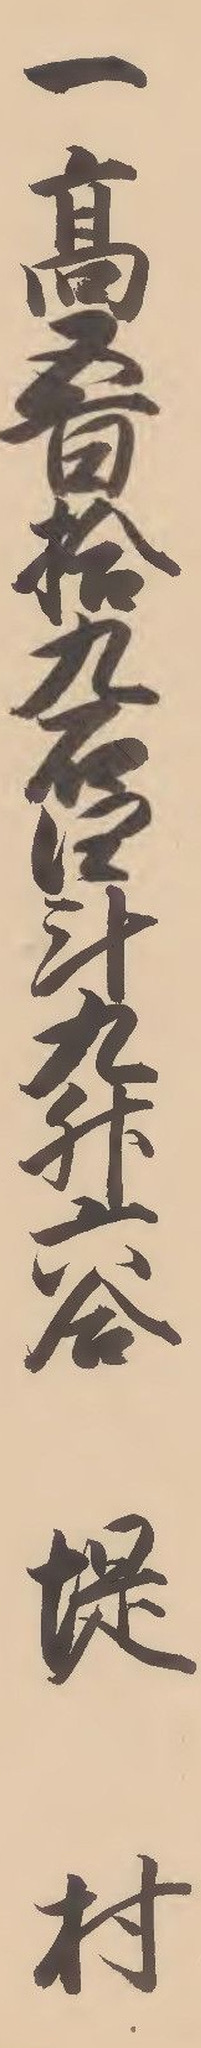一高五百拾九石四斗九升六合堤村
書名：武蔵国郷帳　下
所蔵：国立公文書館 National Archives of Japan
